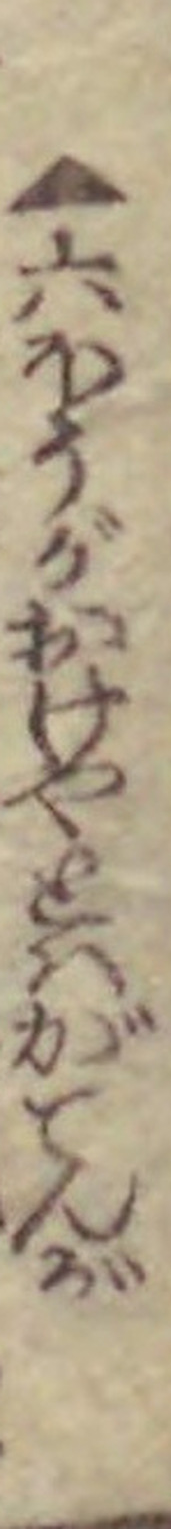▲六ほうがおけやとはがてんが
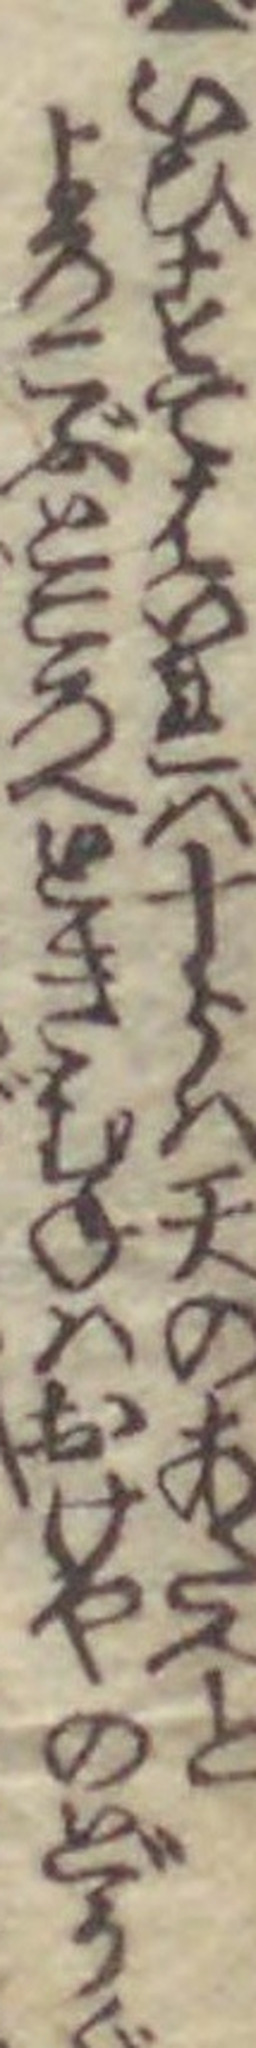よろこぶところへときむねはおけやのどうぐ
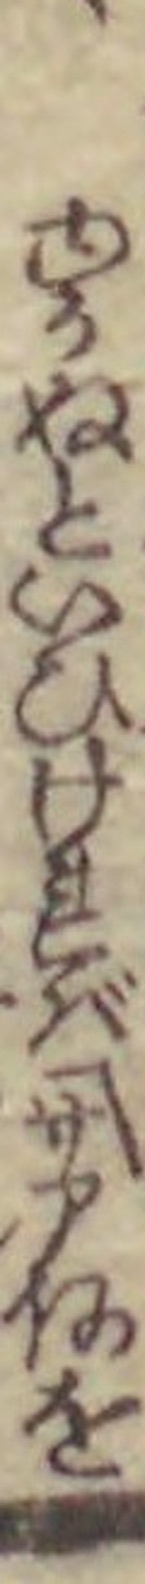ゆかぬといひければ〽サア何を
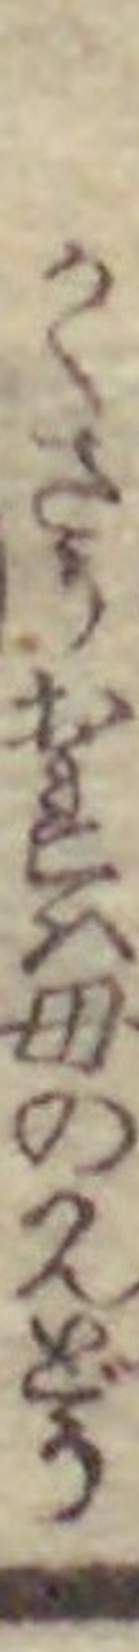かくさうおれは母のかんどう
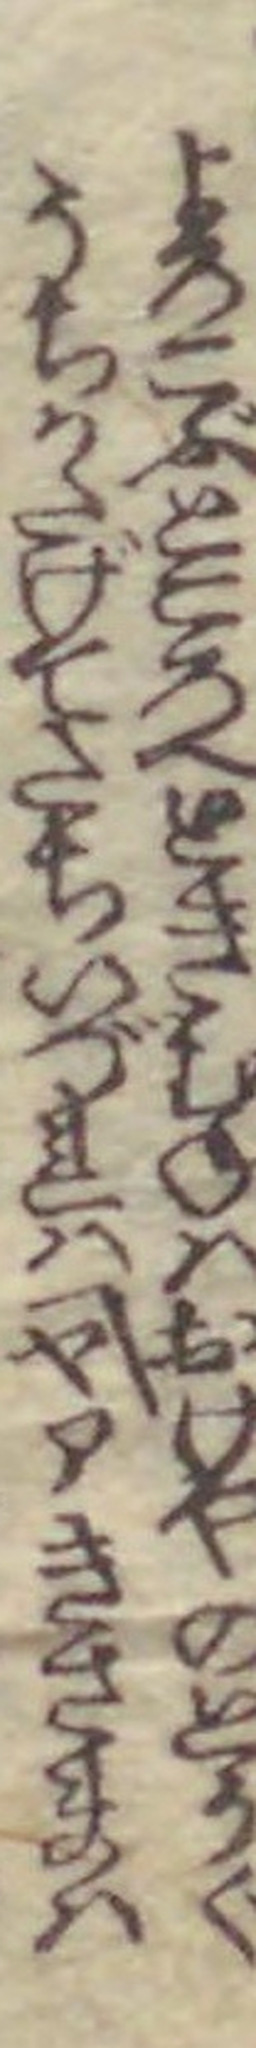うちかたげてたちいづれは〽ヤアきさまは
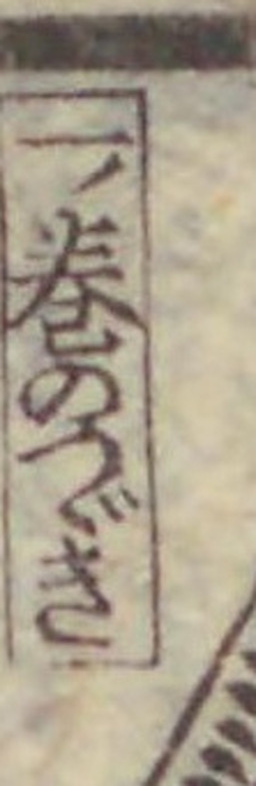一ノ巻のつゞき
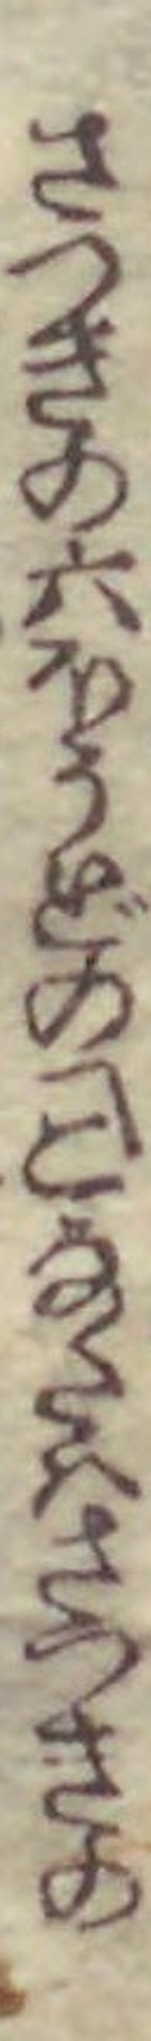さつきの六ほうどの〽こなたはさつきの
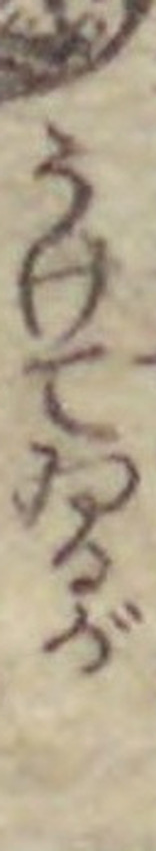うけてゐるが
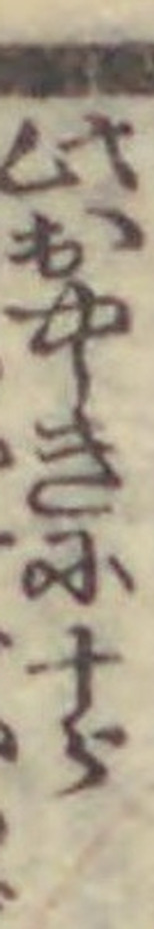此おやしきに十郎
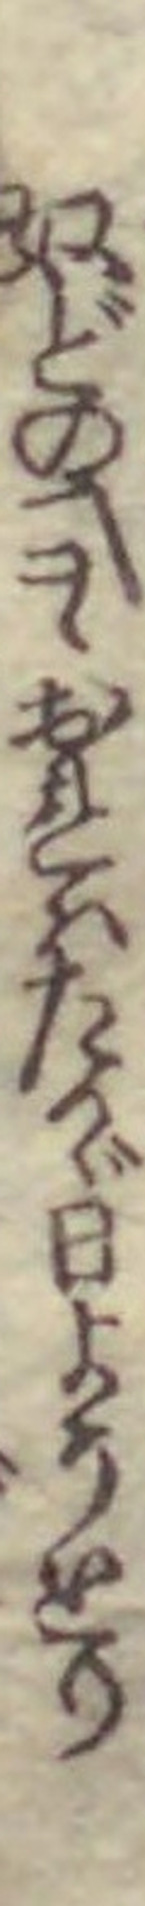奴どの〽ヲヽおれはたかゞ日ようとり
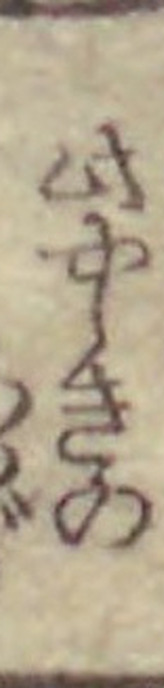此やしきの
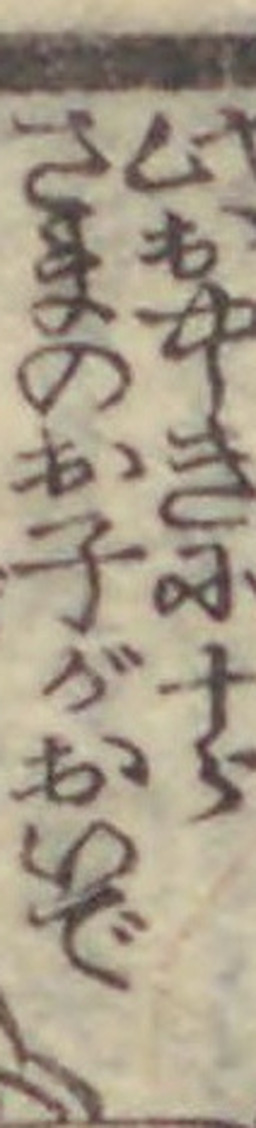さまのお子がおいで
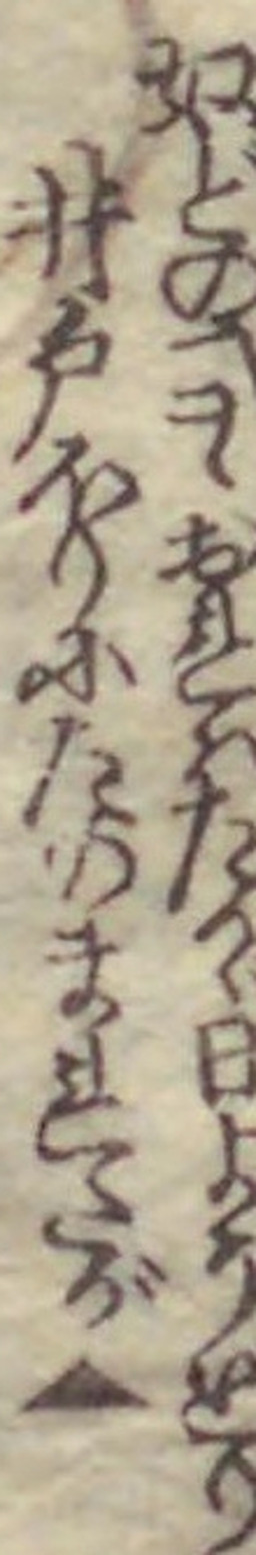井戸ほりにたのまれたが▲
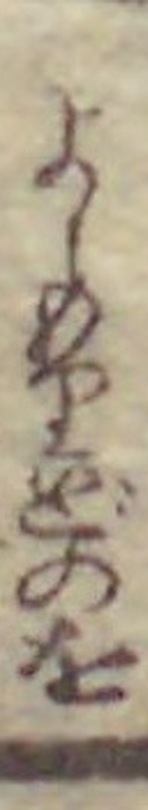よしもりどのを
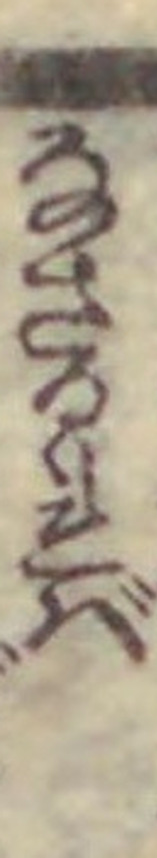なさるれば
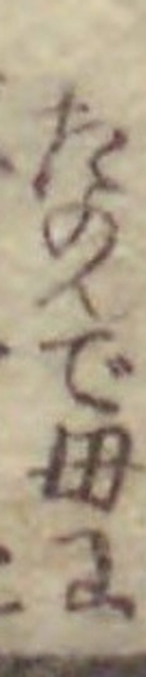たのんで母に
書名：大時代唐土化物 3巻. 曽我太夫染
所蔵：国立国会図書館 National Diet Library, JAPAN
